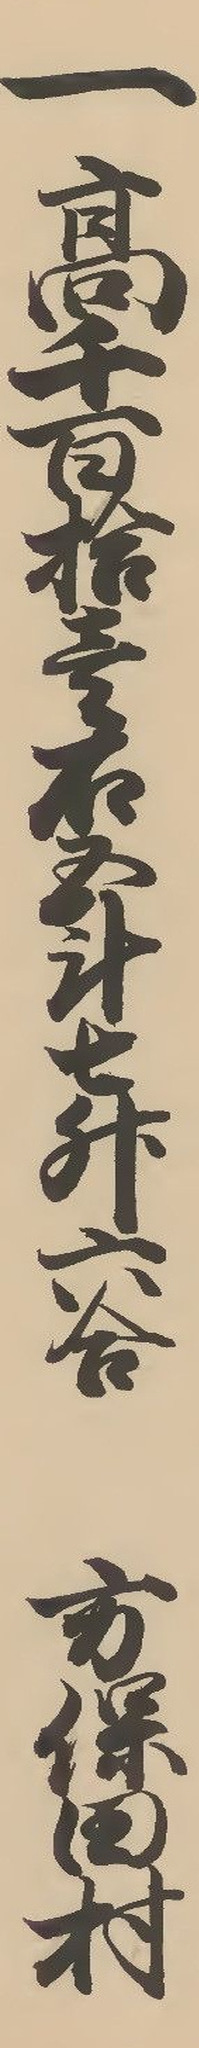一髙千百拾壱石五斗七升六合方保田村

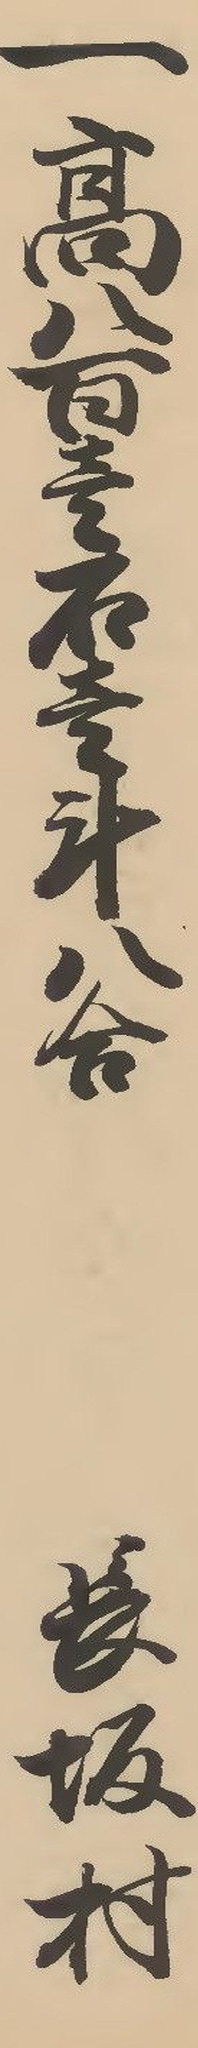一髙八百壱石壱斗八合長坂村
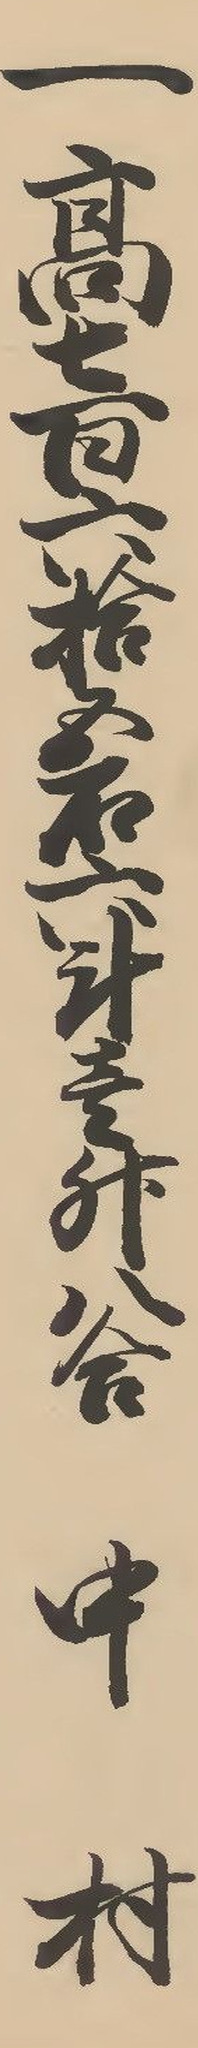一髙七百六拾五石六斗壱升八合中村
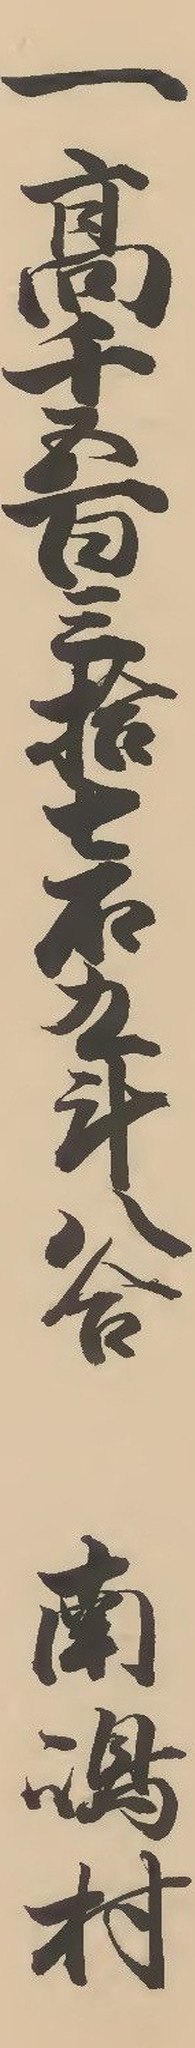一髙千五百三拾七石九斗八合南嶋村
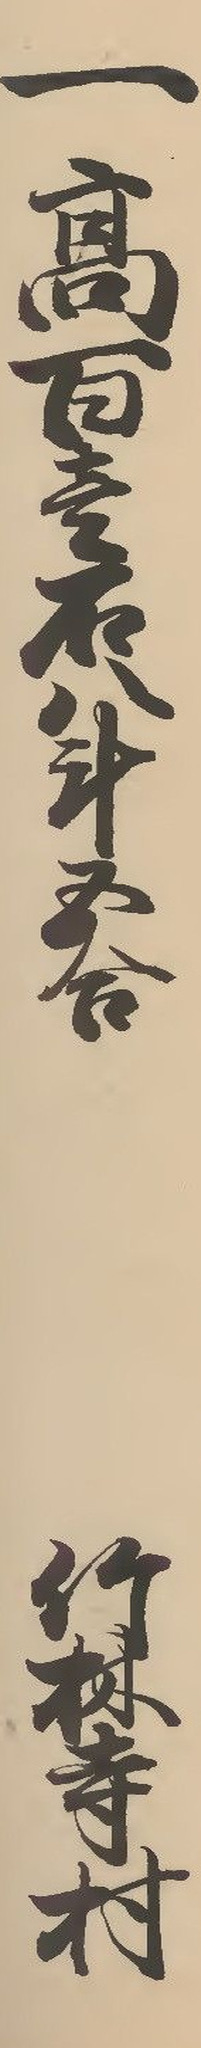一髙百壱石八斗五合竹林寺村
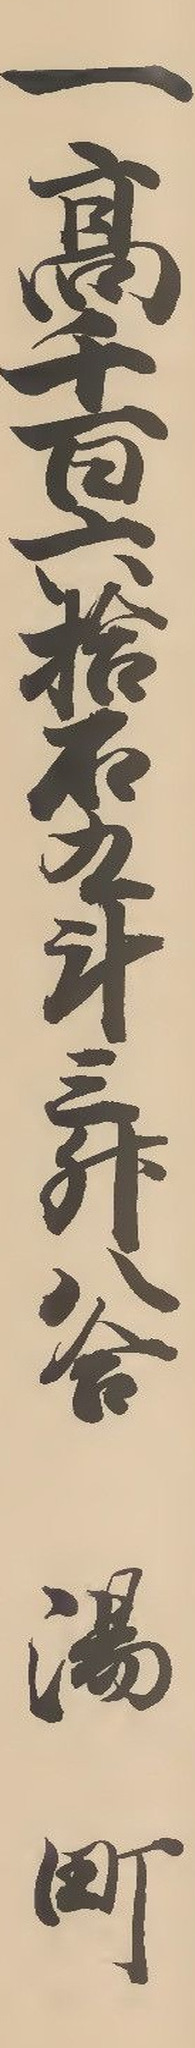一髙千百六拾石九斗三升八合湯町
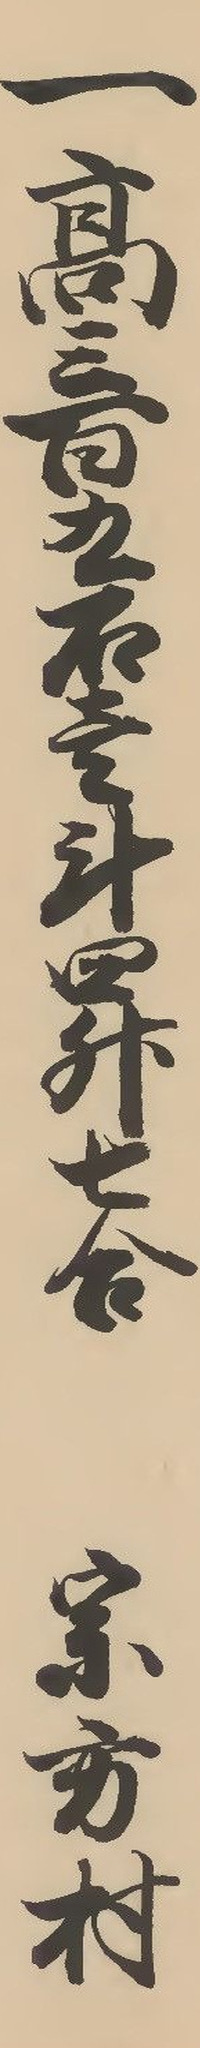一髙三百九石壱斗四升七合宗方村
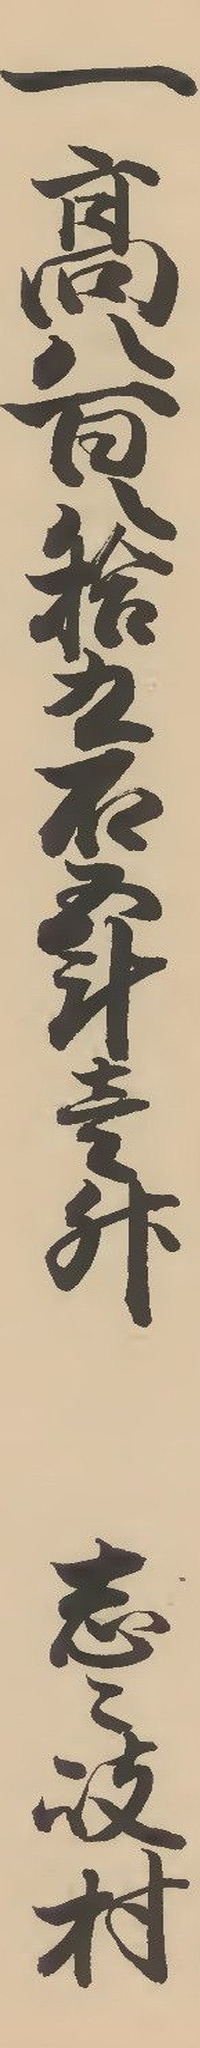一髙八百八拾九石五斗壱升志々岐村
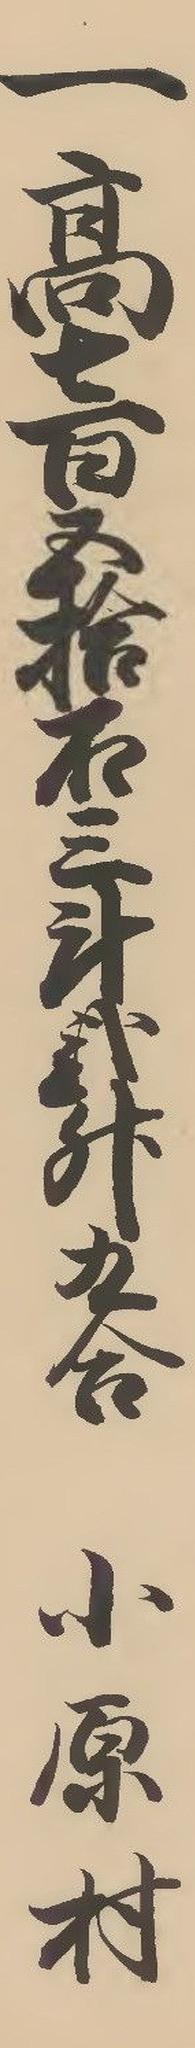一髙七百五拾石三斗弐升九合小原村

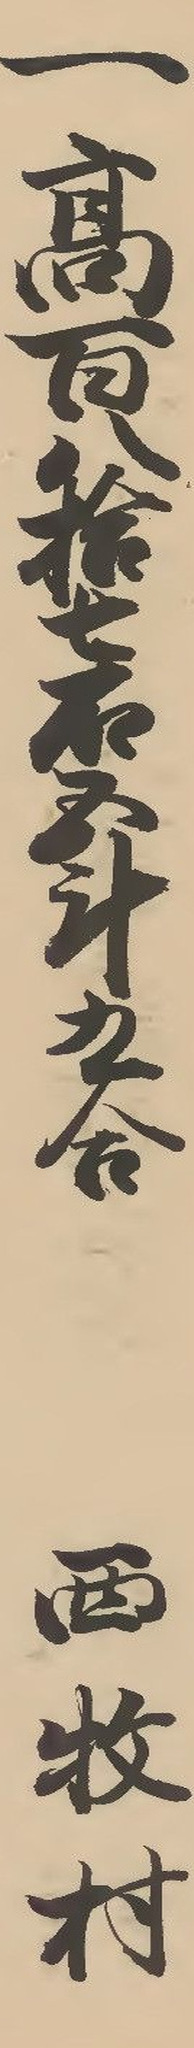一髙百八拾七石五斗九合西牧村
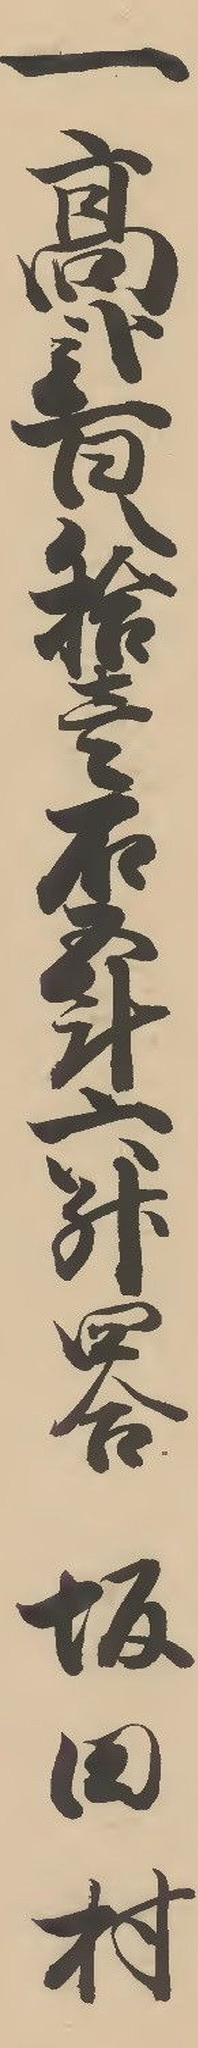一髙弐百八拾壱石五斗六升四合坂田村
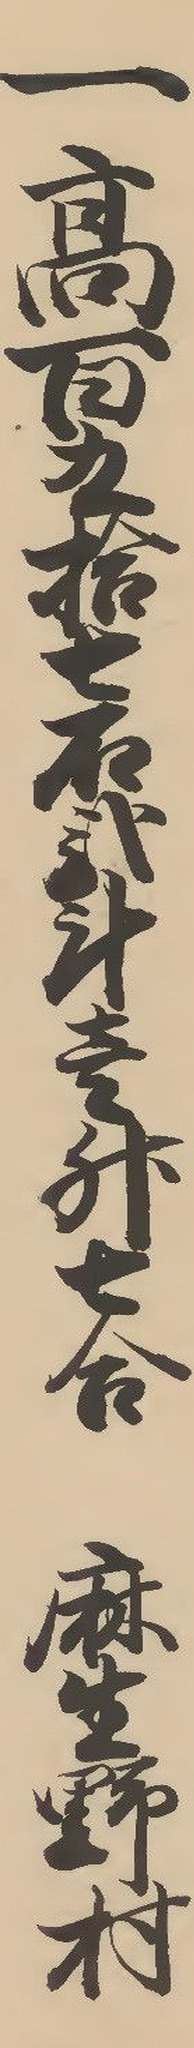一髙百九拾七石弐斗壱升七合麻生野村
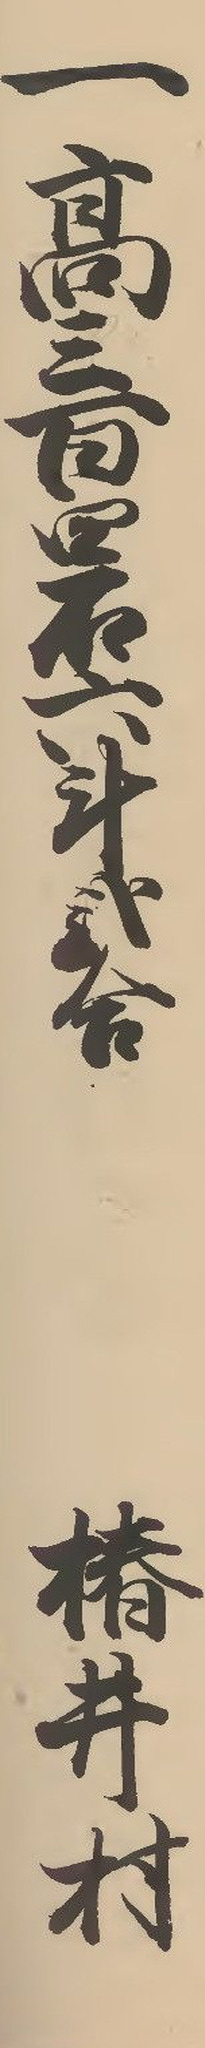一髙三百四石六斗弐合椿井村
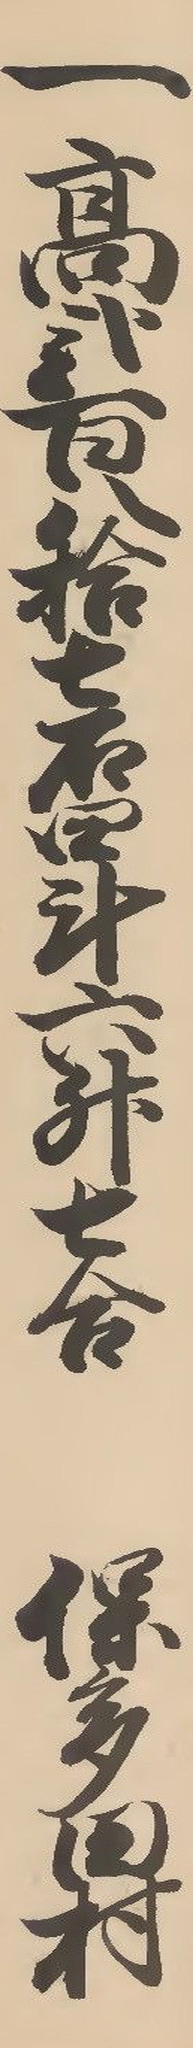一髙弐百八拾七石四斗六升七合保多田村
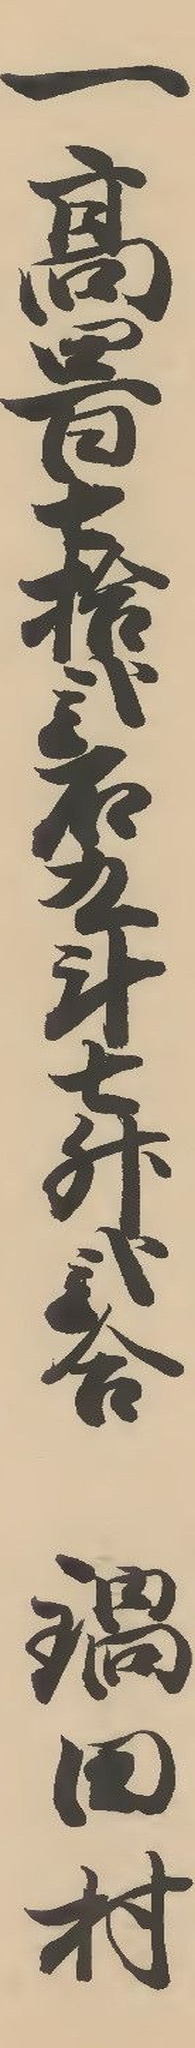一髙四百七拾弐石九斗七升弐合鍋田村
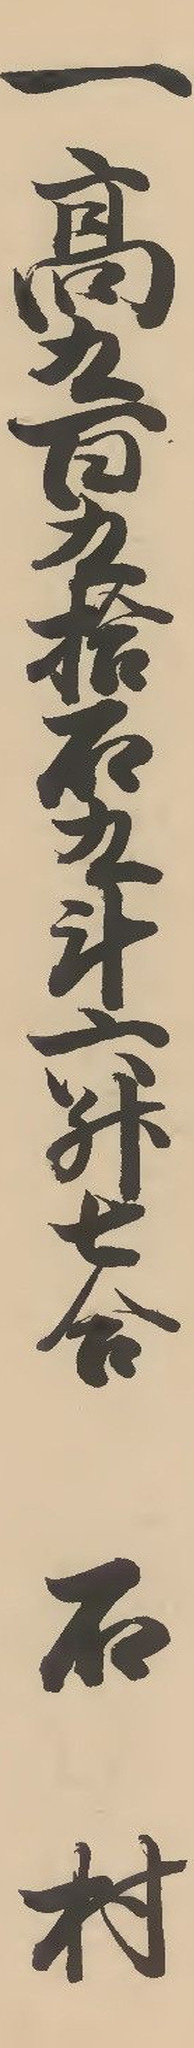一髙九百九拾石九斗六升七合石村
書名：肥後国郷帳
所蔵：国立公文書館 National Archives of Japan
